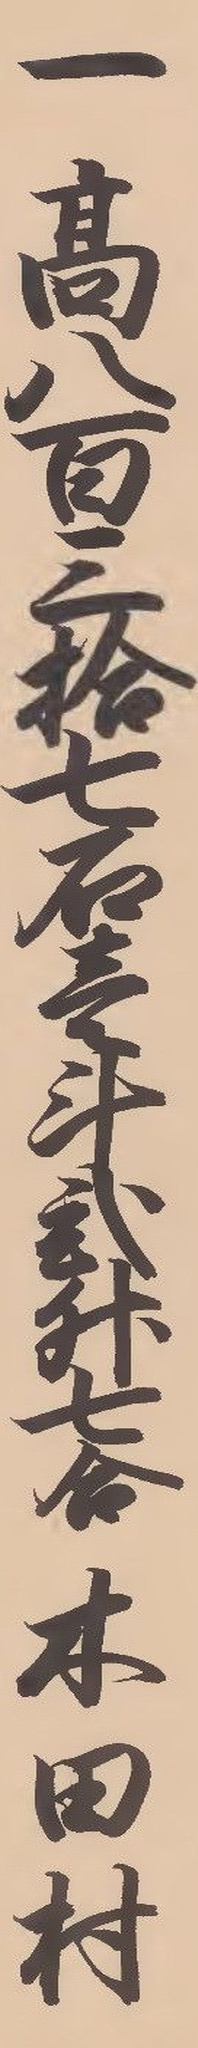一髙八百三拾七石壱斗弐升七合木田村
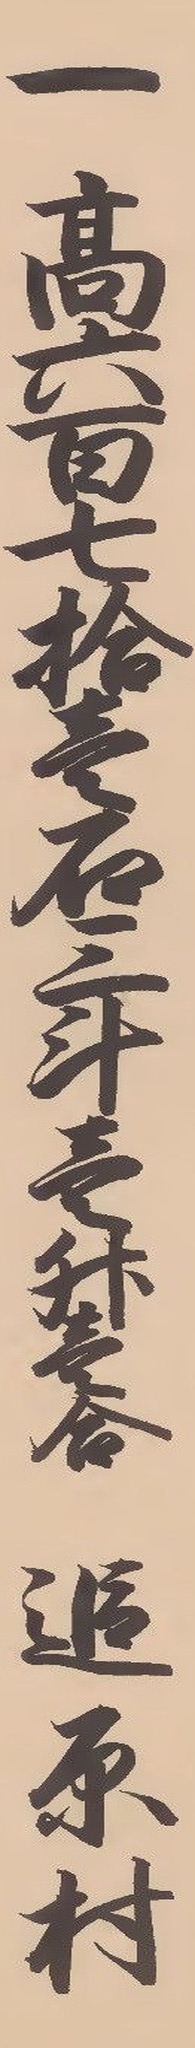一髙六百七拾壱石三斗壱升壱合追原村
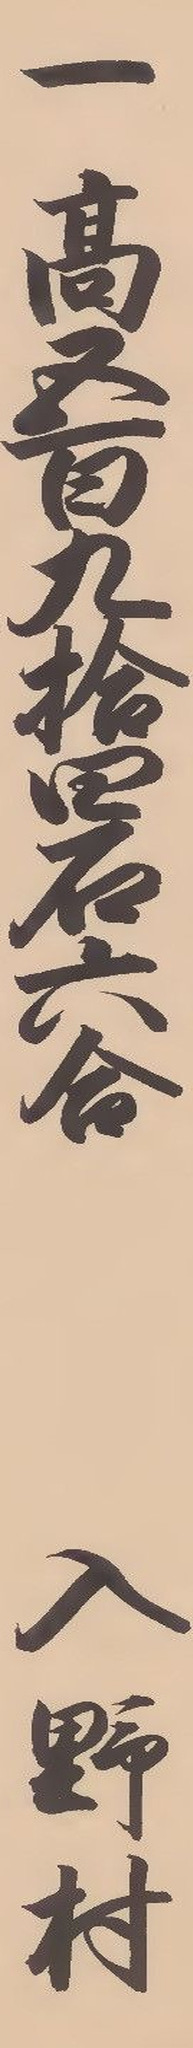一髙五百九拾四石六合入野村
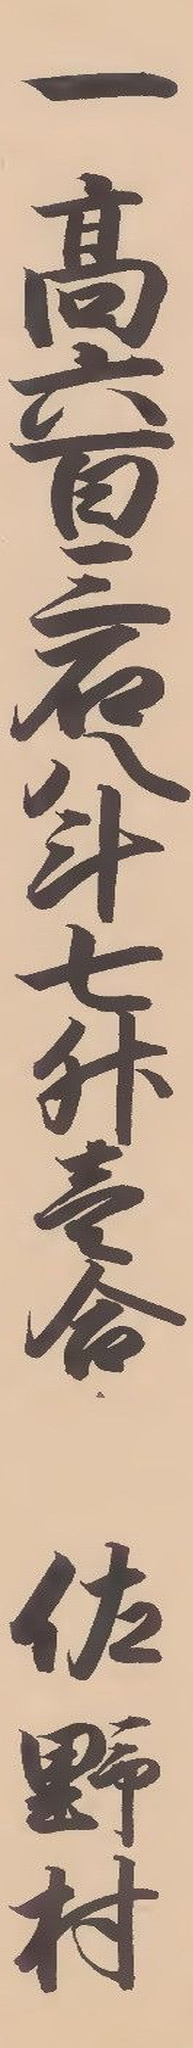一髙六百三石八斗七升壱合佐野村
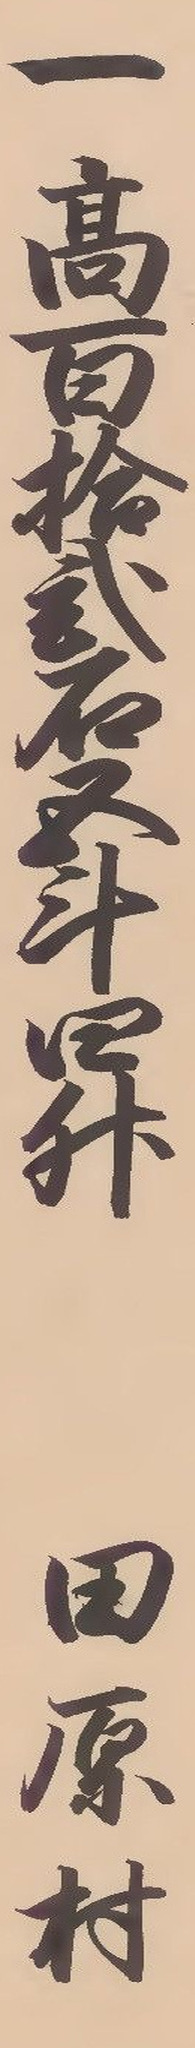一髙百拾弐石五斗四升田原村

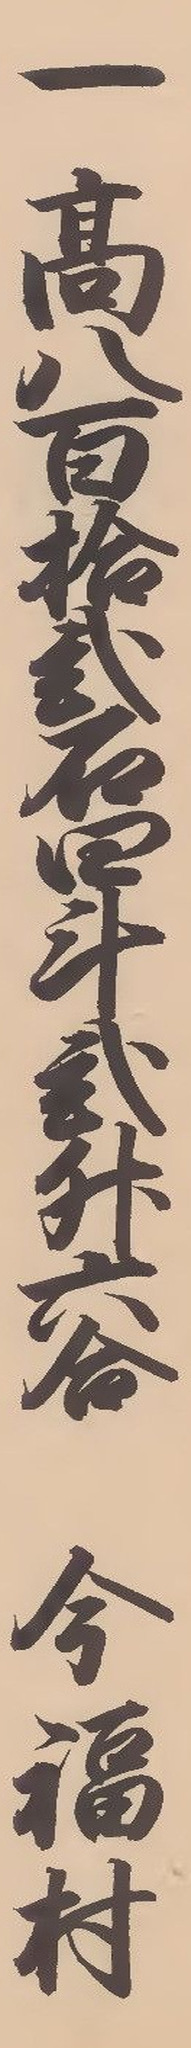一髙八百拾弐石四斗弐升六合今福村
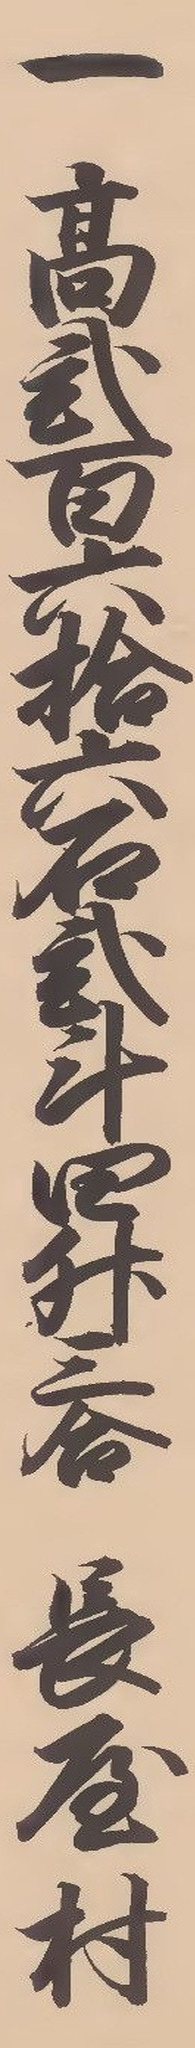一髙弐百六拾六石弐斗四升三合長屋村
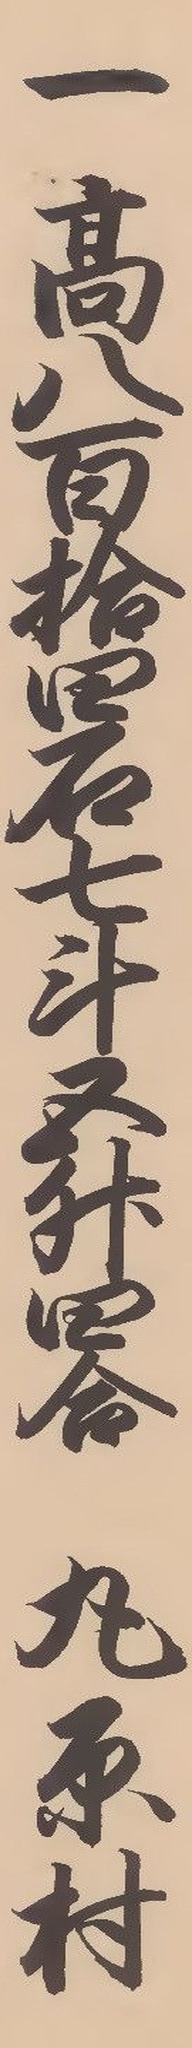一髙八百拾四石七五升四合丸原村
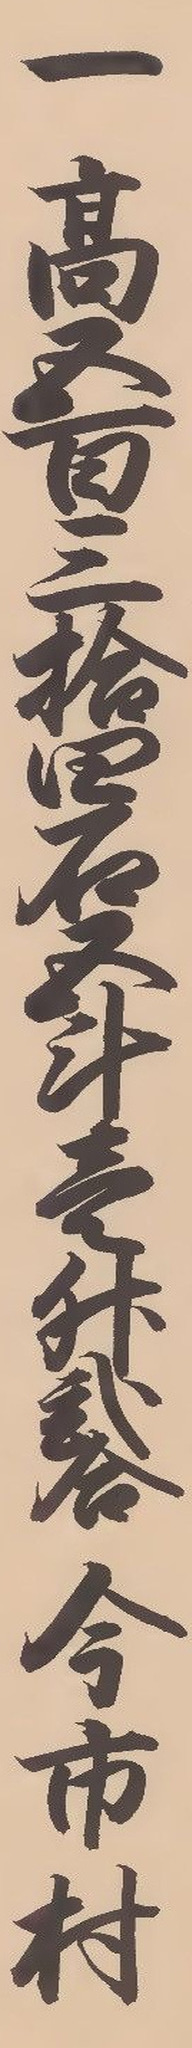一髙五百三拾四石五斗壱升弐合今市村
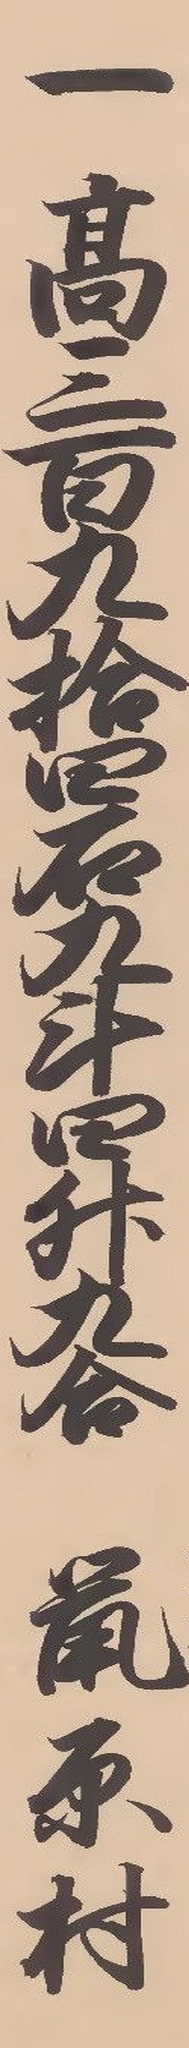一髙三百九拾四石九斗四升九合鼠原村
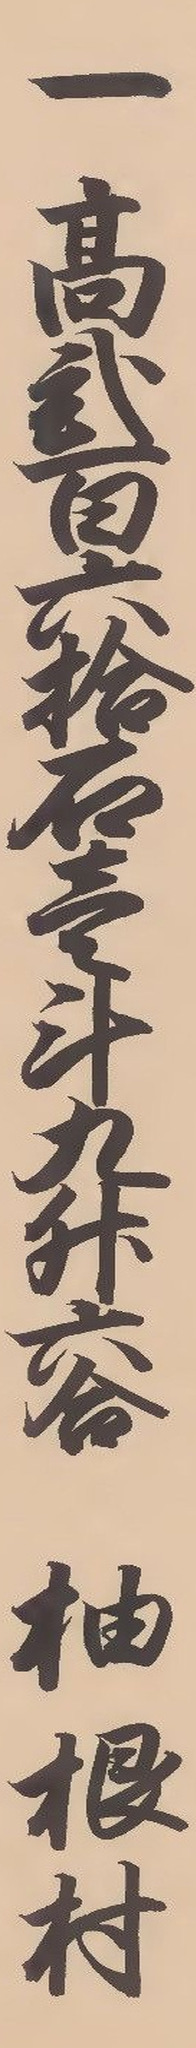一髙弐百六拾石壱斗九升六合柚根村
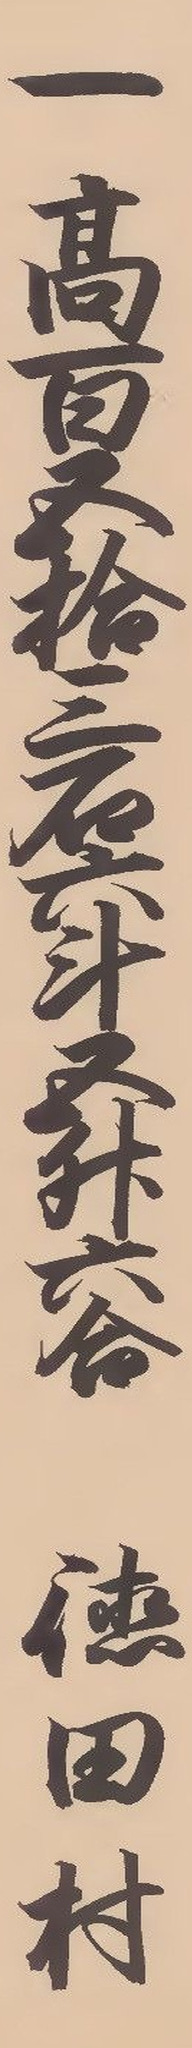一髙百五拾三石六斗五升六合徳田村
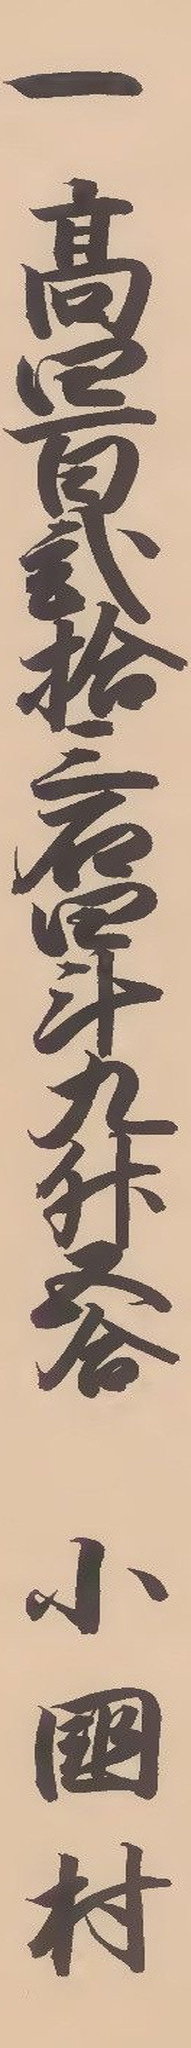一髙四百弐拾三石四斗九升五合小國村

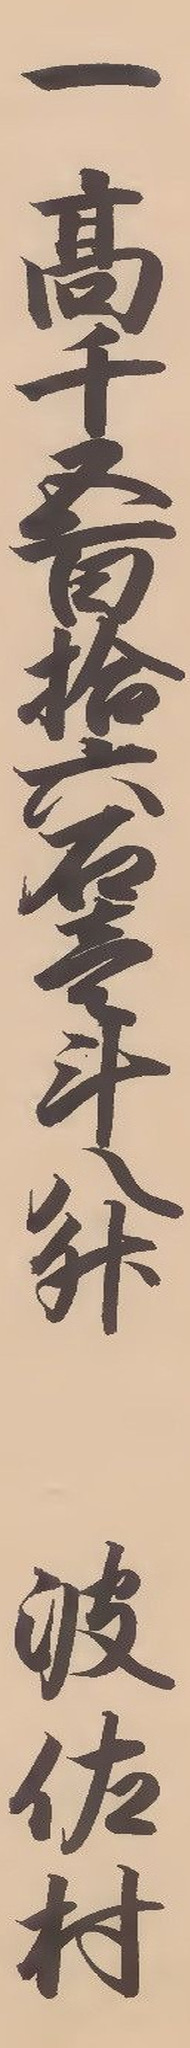一髙千五百拾六石壱斗八升波佐村
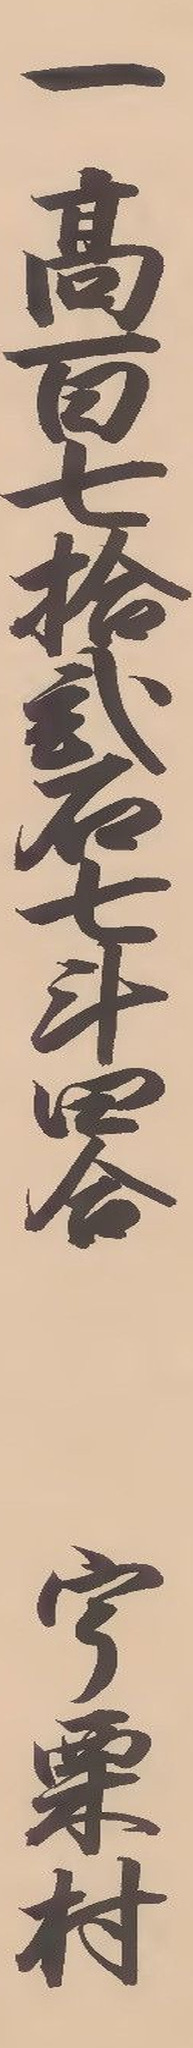一髙百七拾弐石七斗四合宇栗村
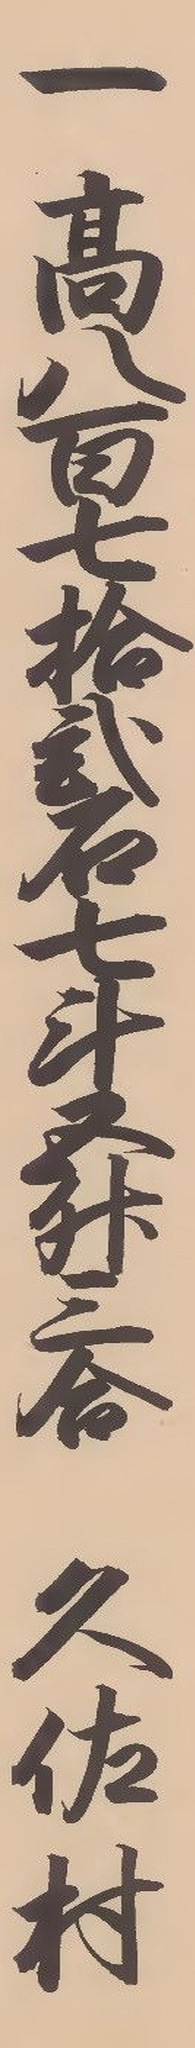一髙八百七拾弐石七斗五升三合久佐村
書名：石見国郷帳
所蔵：国立公文書館 National Archives of Japan
